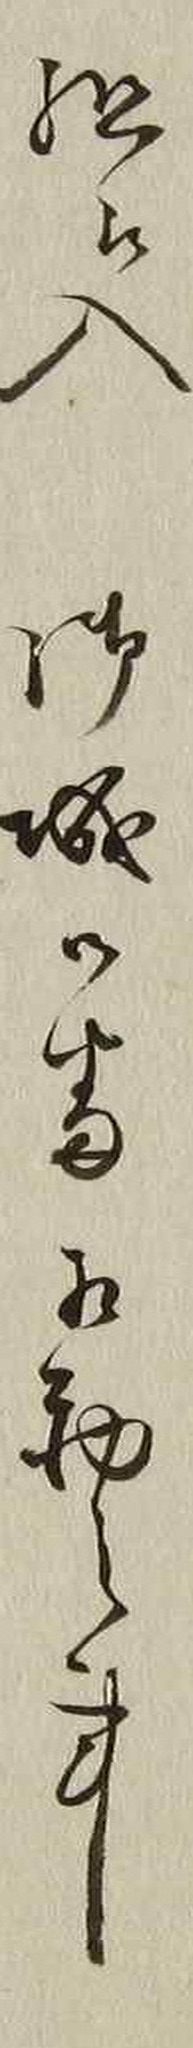組へ入御城御番相勤め候事
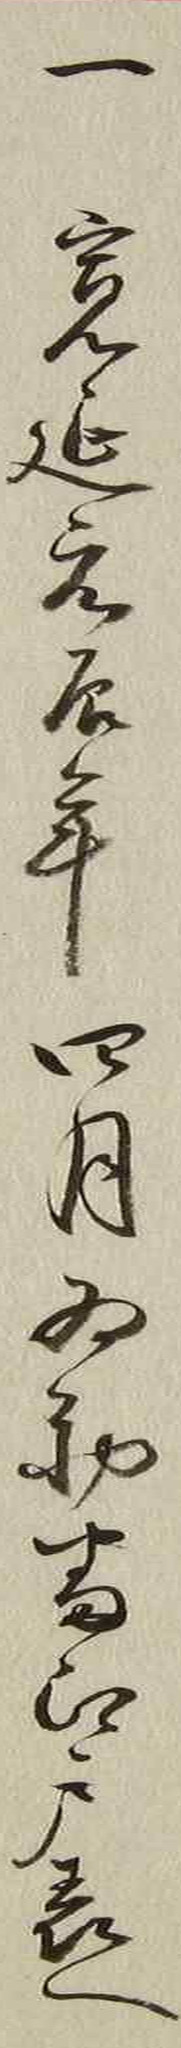一寛延元辰年四月勤番之為江戸表へ
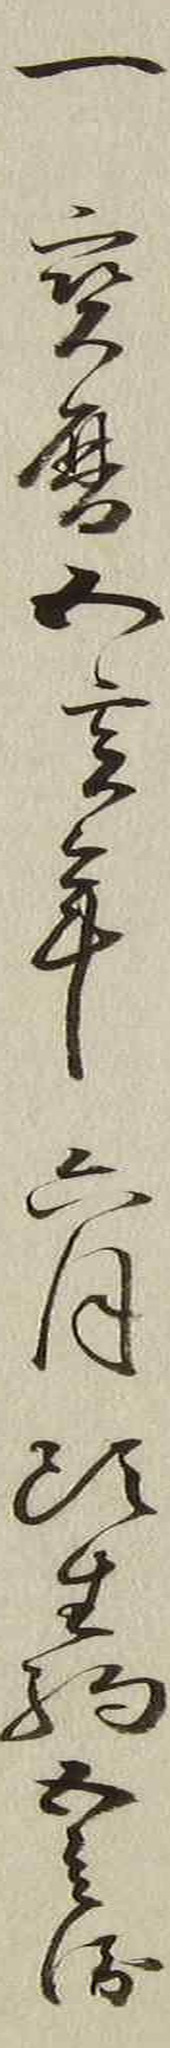一宝暦五亥年六月頭生駒五兵衛
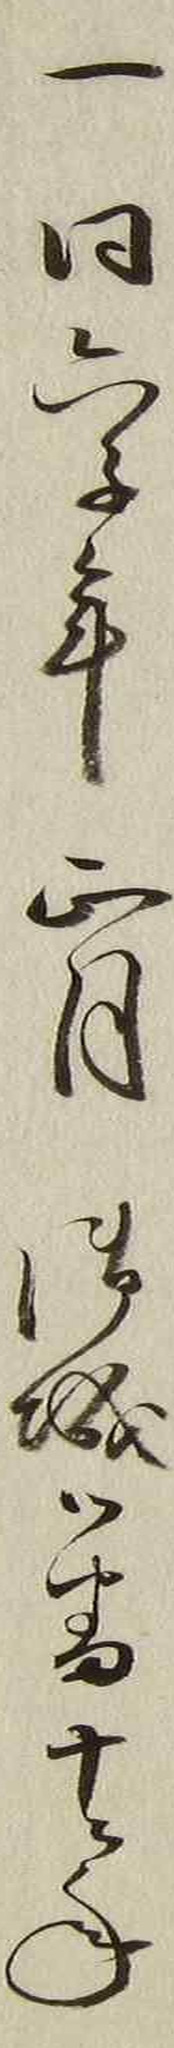一同六子年正月御城御番十二年
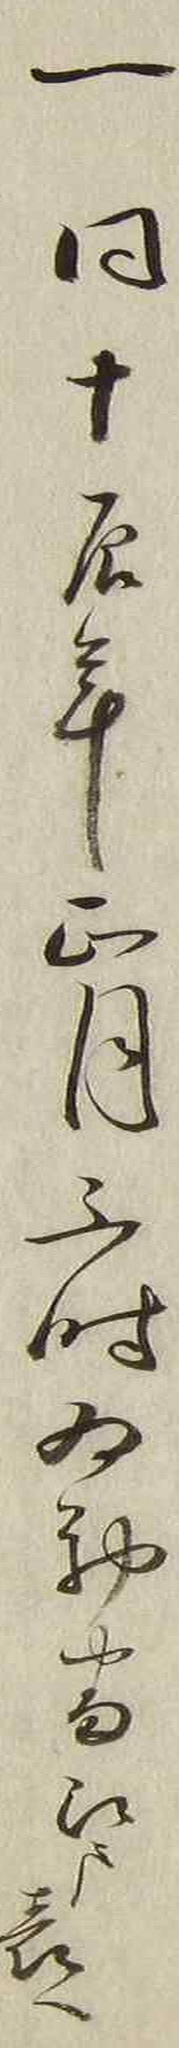一同十辰年正月不時勤番之為江戸表へ

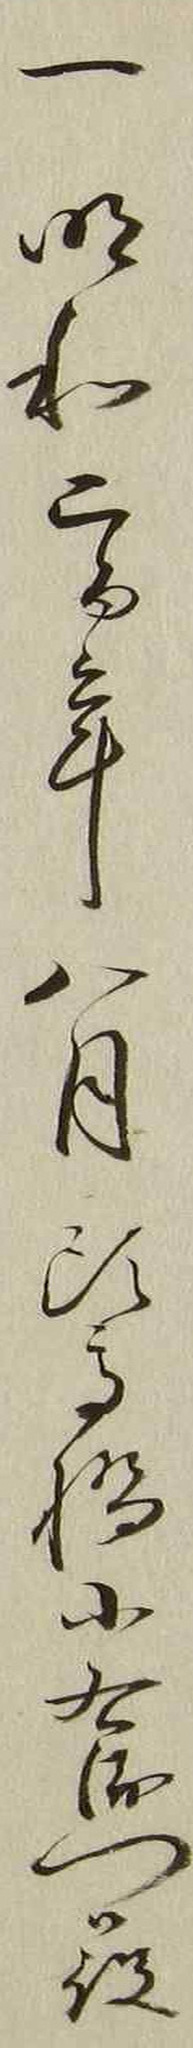一明和二酉年八月頭高橋小右衛門御役
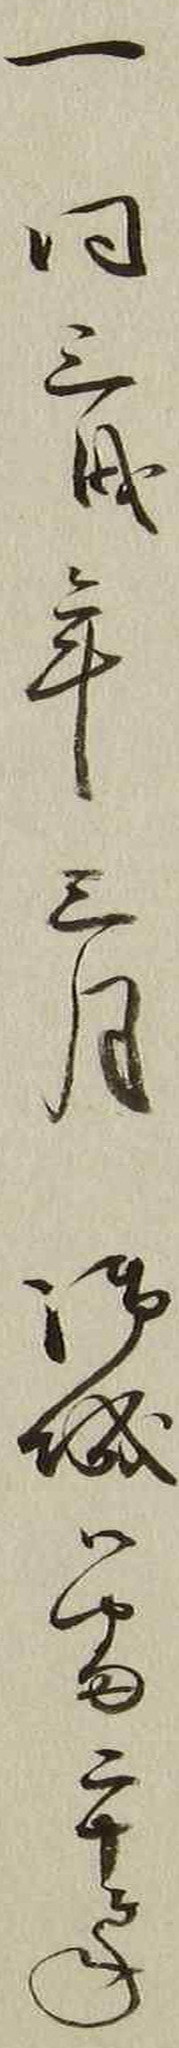一同三戌年三月御城御番二十ケ年
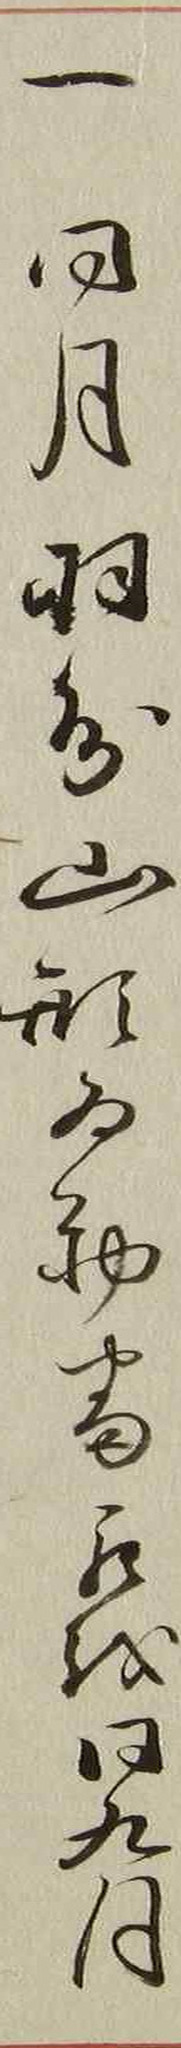一同月羽州山形勤番之為罷り越同九月
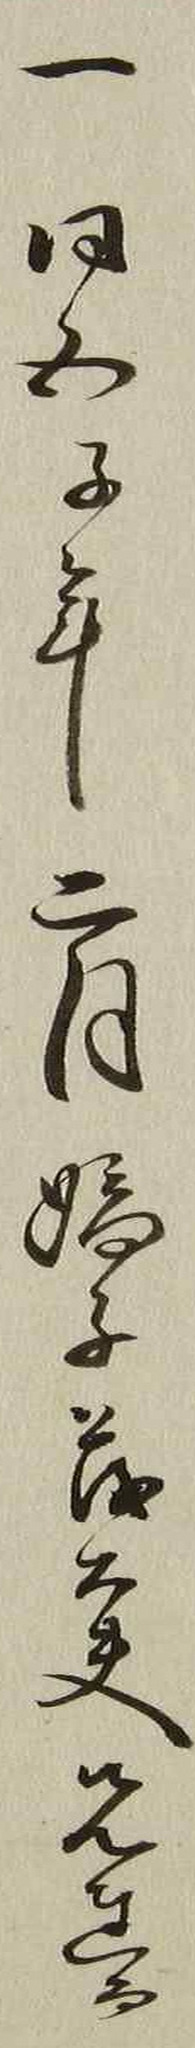一同五子年二月嫡子茂大夫先達て
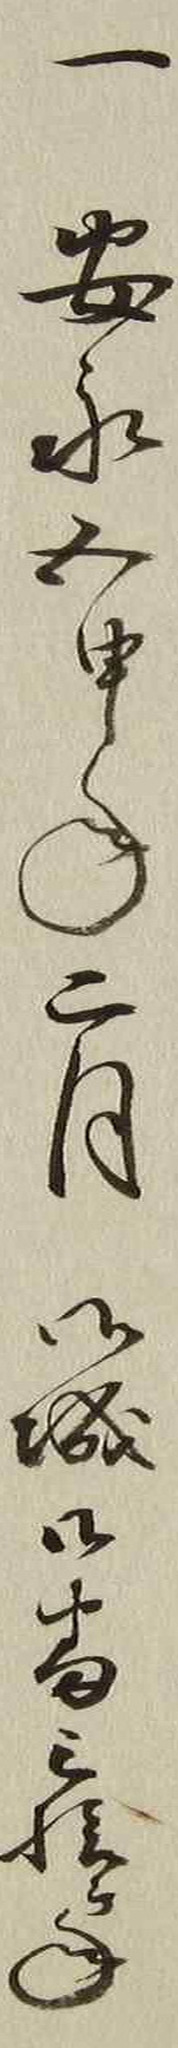一安永五申年二月御城御番三拾ケ年
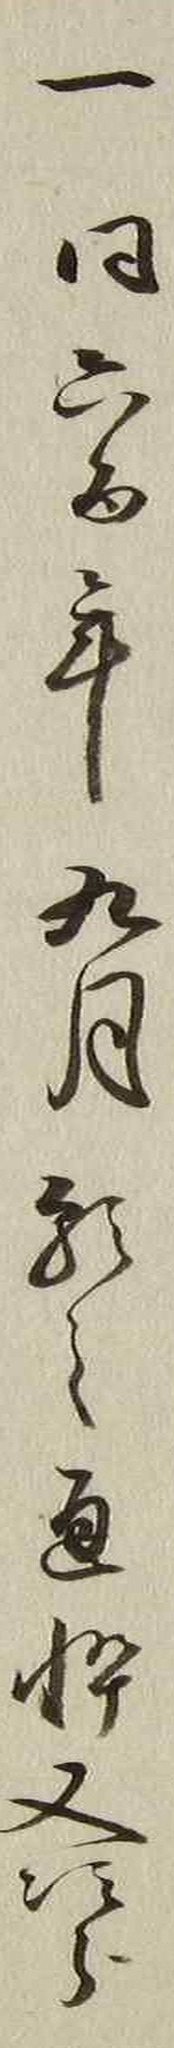一同六酉年九月願い之通り倅又次郎
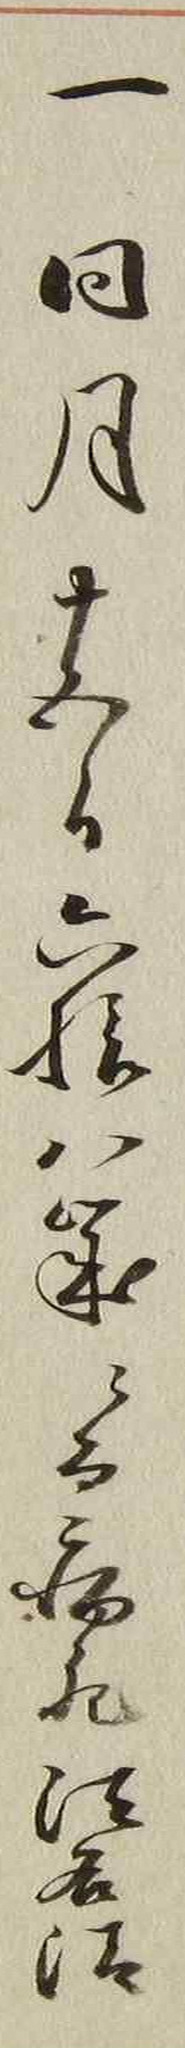一同月十五日六拾八歳ニて病死法名清
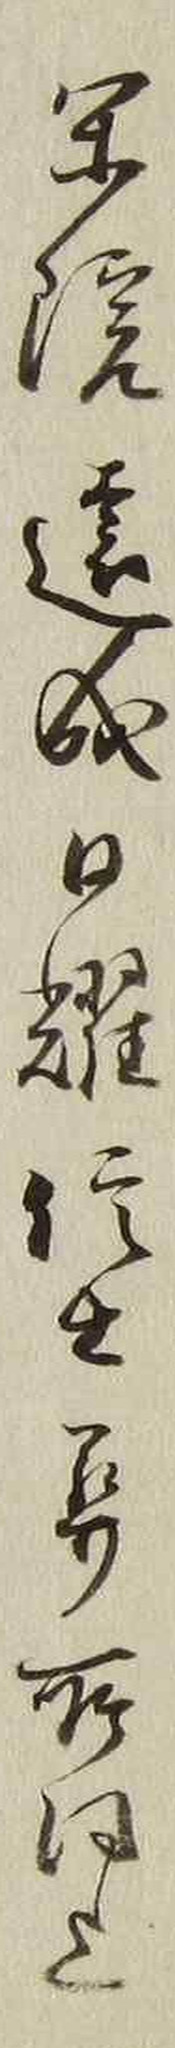閑院遠成日耀信士葬所同上
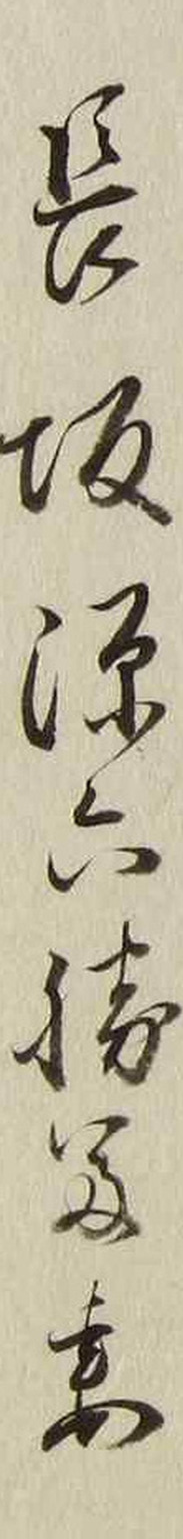女長坂源六勝重妻
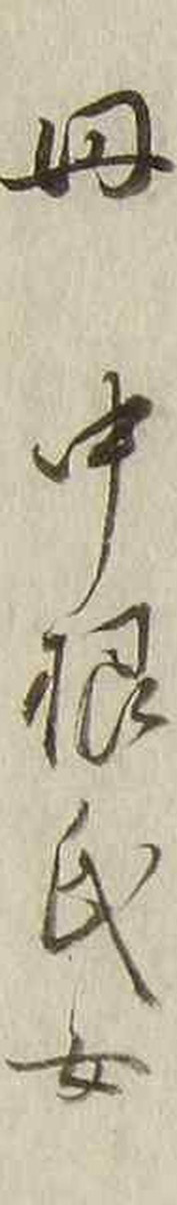母中根氏女

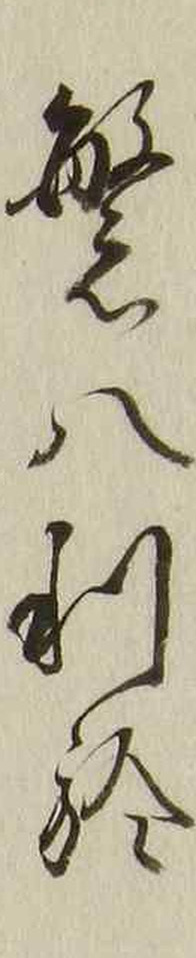繁八利於
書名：諸士系譜　巻之20　い之部20
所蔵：会津若松市立会津図書館
